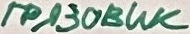грязовик
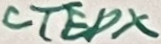стерх
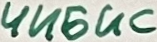чибис
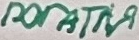рогатая
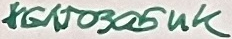желтозобик
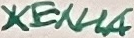желна
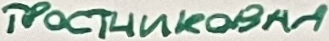тростниковая
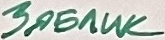зяблик
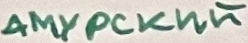амурский
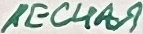лесная
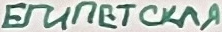египетская
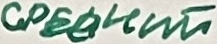средний
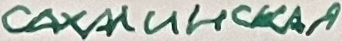сахалинская
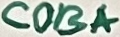сова
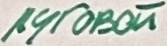луговой
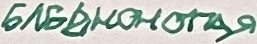бледноногая
